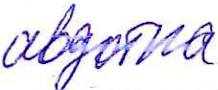авдотка
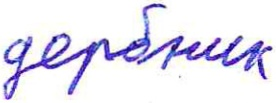дербник
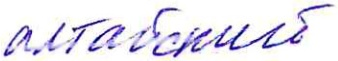алтайский
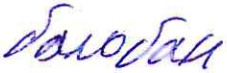балобан
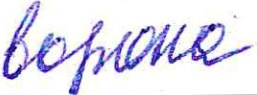ворюна
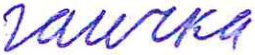гаичка
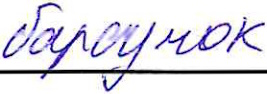барсучок
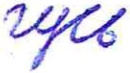гусь
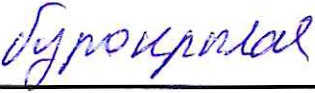бурокрылая
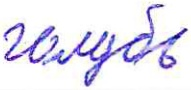голубь
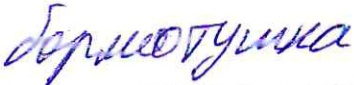бормотушка
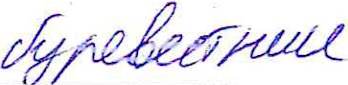буревестник
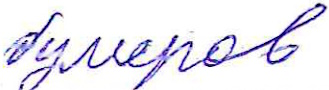бумеров
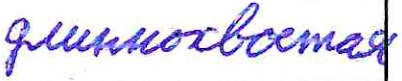длиннохвостая
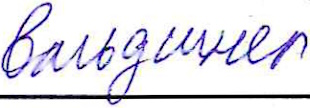вальдшнеп
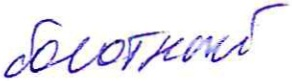болотный
